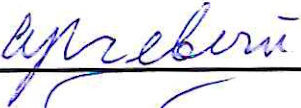арчевый
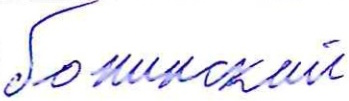бонинский
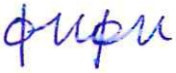фифи
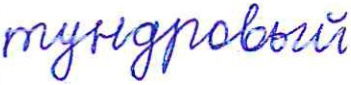тундровый
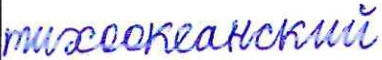тихоокеанский
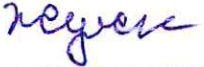жулек
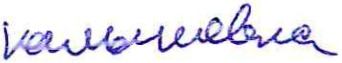камышевка
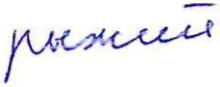рыжий
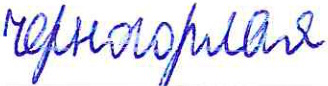черногорлая
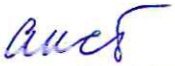аист
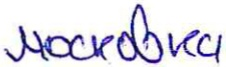московка
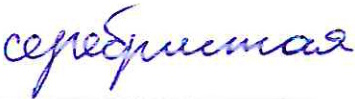серебристая
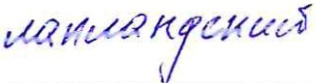лапландский
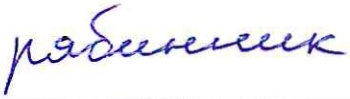рябинник
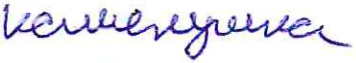каменушка
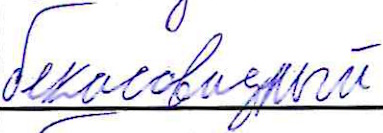бекасовидный
